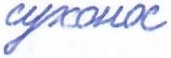сухонос
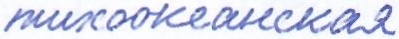тихоокеанская
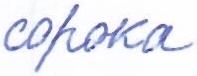сорока
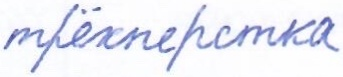трёхперстка
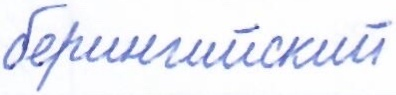берингийский
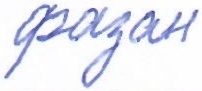фазан
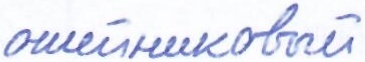ошейниковый
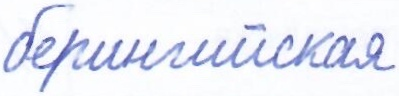берингийская
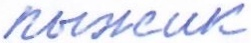пыжик
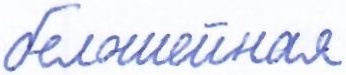белошейная
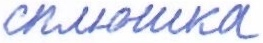сплюшка
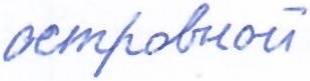островной
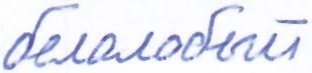белолобый
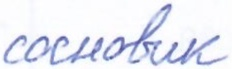сосновик
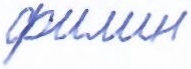филин
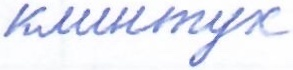клинтух
